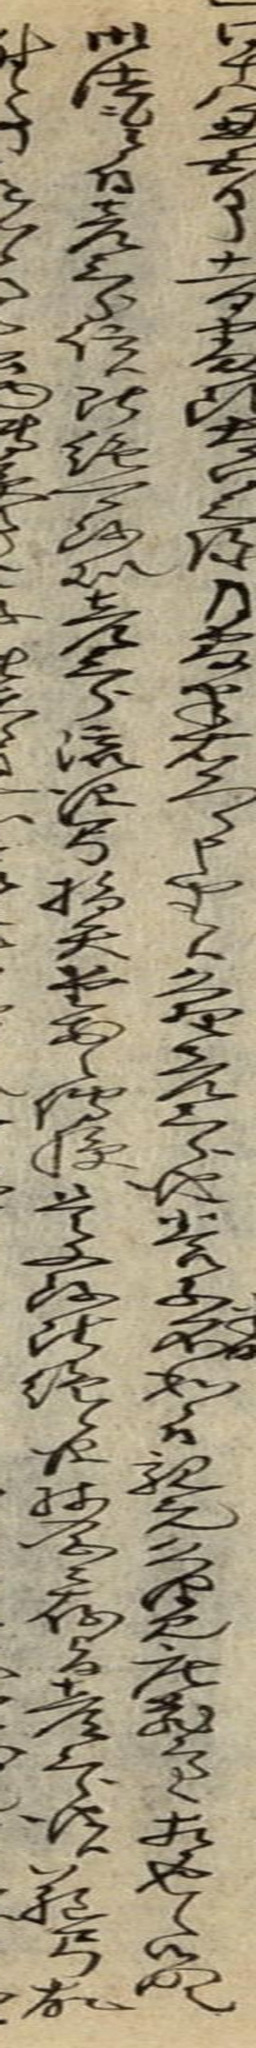御法も候ニ付彦三郎跡は断絶可致処彦三郎流儀弓指矢堂前之伝授是又致断絶候儀残念に存旨彦三郎儀は難弓故
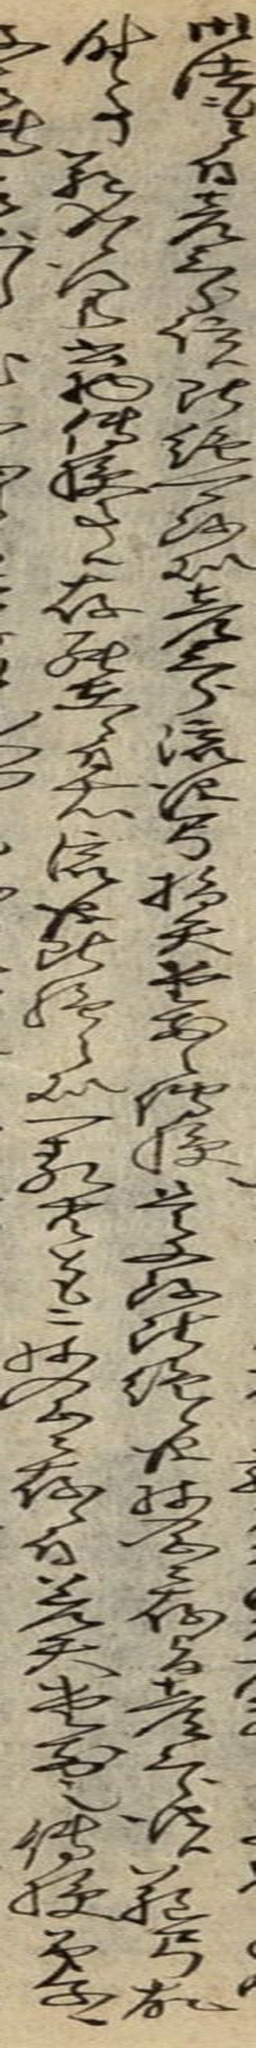時之事難成候得共書物伝授事ハ存罷在候ニ付右流儀断絶之処一類共ともニ残念ニ存候付差矢堂前之伝授弟子へ
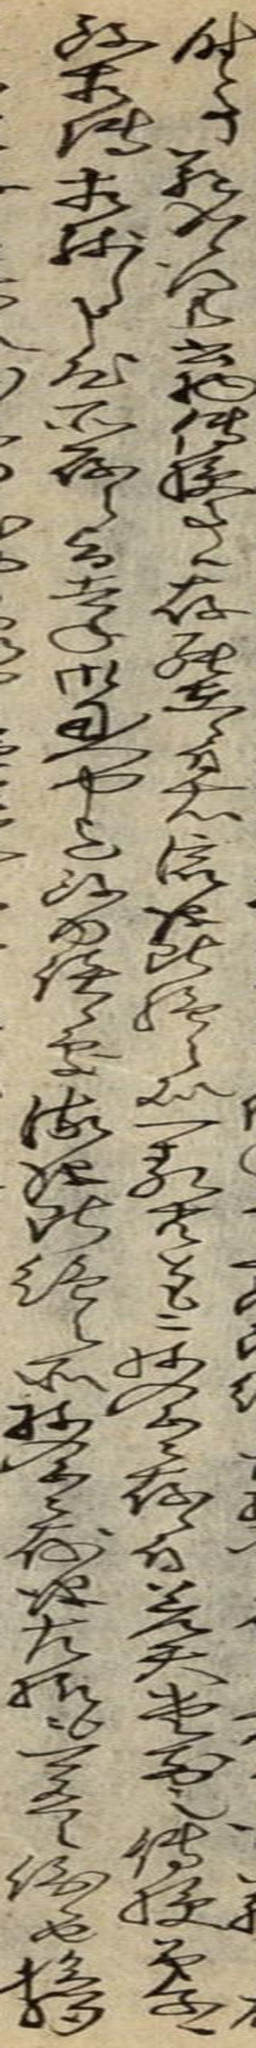致相伝相残申度所存之旨去年御用人中迄致内談候処流儀断絶之所残念ニ存儀左様も可有之儀候由挨拶
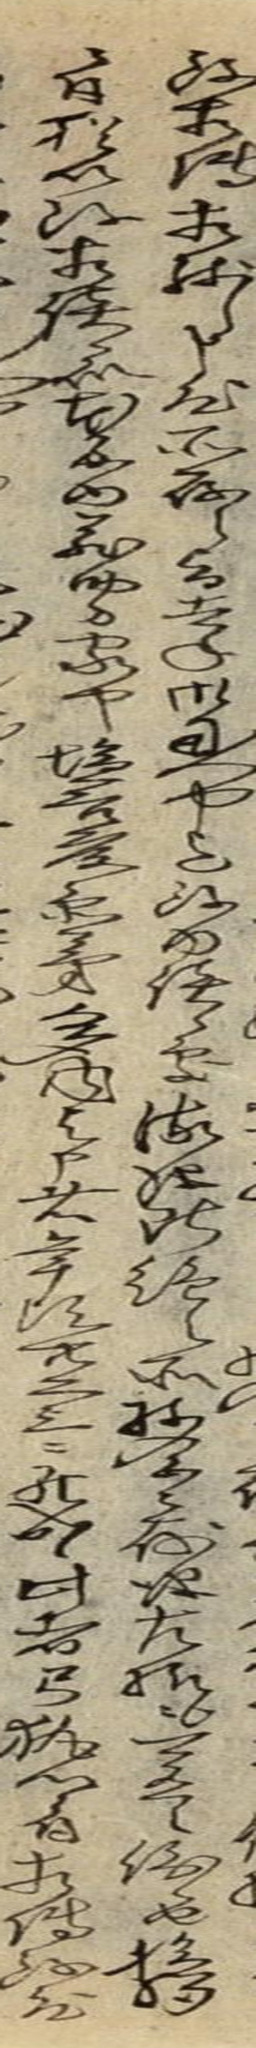ニ付猶以致相談候処本多内蔵助方家中塩谷藤兵衛弟多内与申者年頃廿二三ニ罷成候此者弓執心ニ付相伝致度
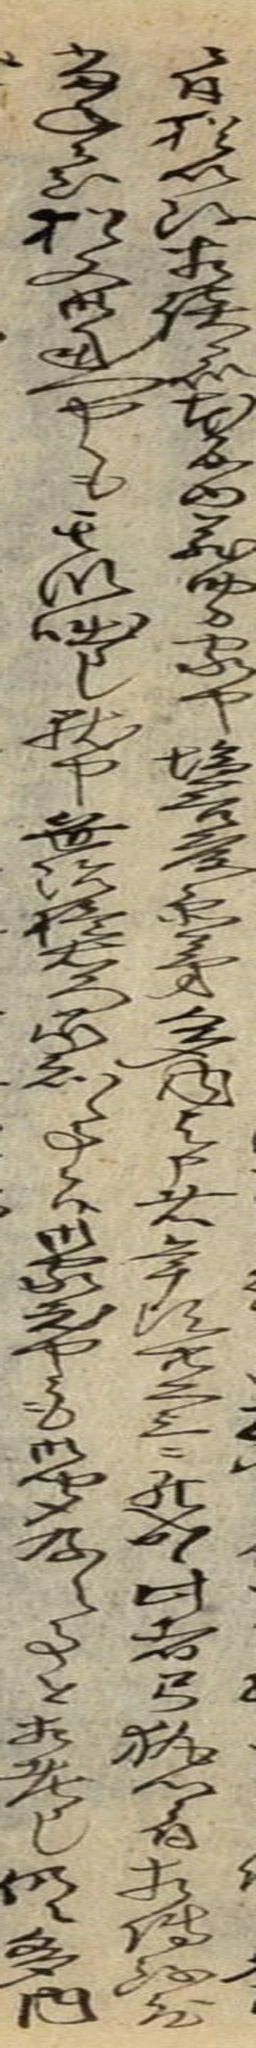当年ニ至猶又御用人中へも其段咄申候就中笹治権右衛門承知之事ニ候御家老中ニも御聞及候事と相考申候仍之多内
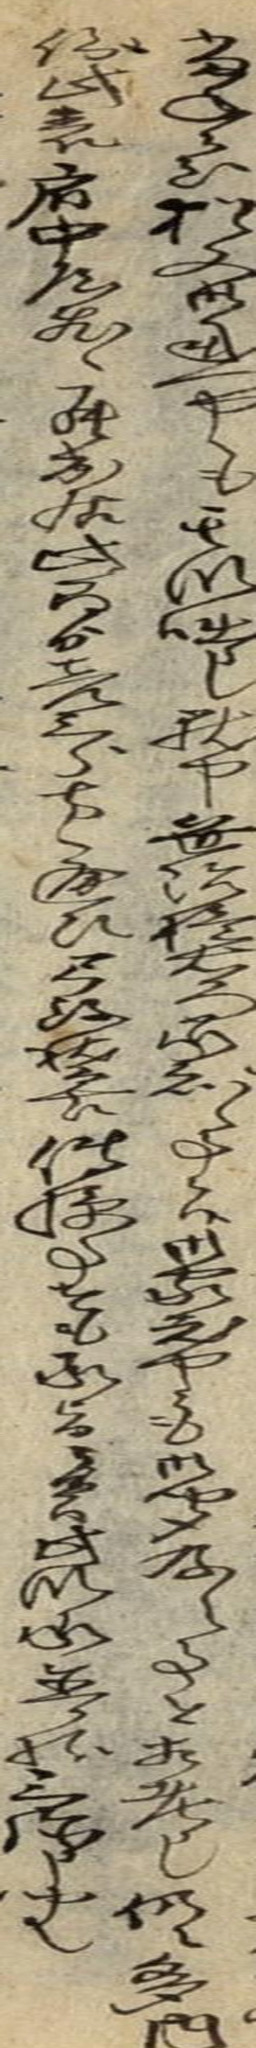儀此表府中屋敷へ罷出居此間ゟ彦三郎方へ通ひ弓致稽古伝授事をも承旨ニ候間此段承置候様三弥申聞候
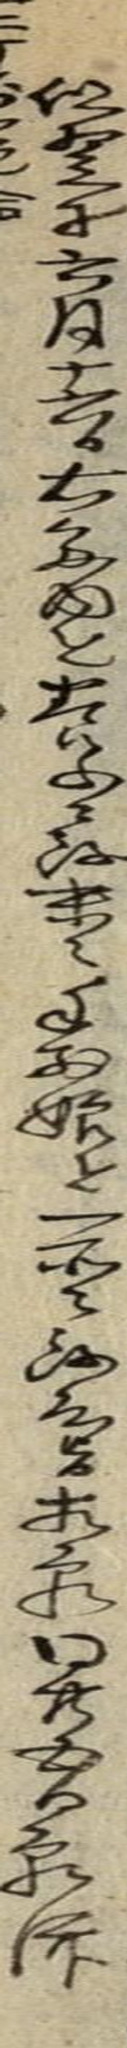但翌刁六月十六日右多内を養子ニ致末々手前娘と一所ニ致度旨相願同廿五日願済
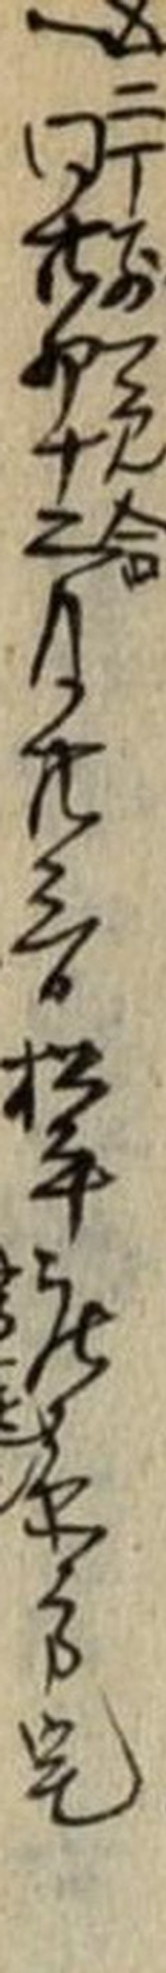一同廿卯十二月廿三日松平庄兵衛方宅
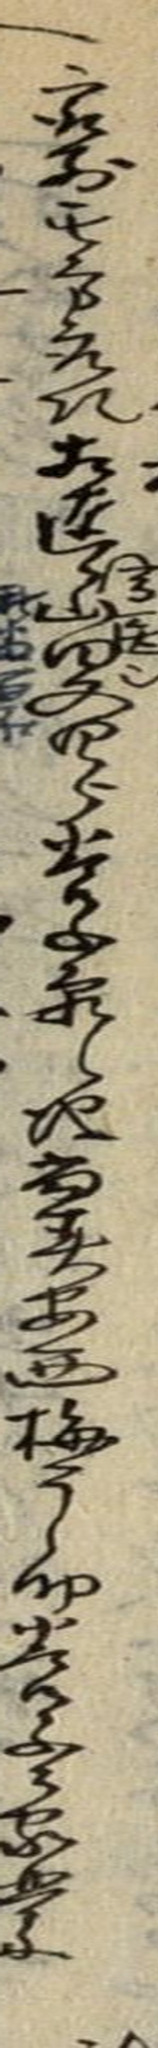最前其方取次相達馬医也山田又四郎養子願之儀当春安西梅干之助養子ニ家業
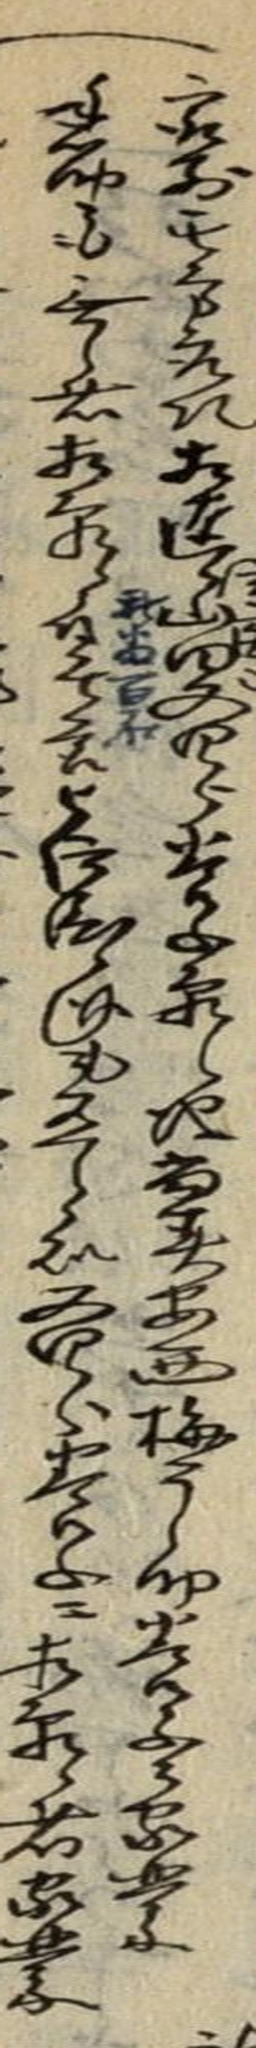手筋ニも無之者相願候ニ付新番百石其節被仰渡候趣も有之処又四郎養子ニ相願候者家業
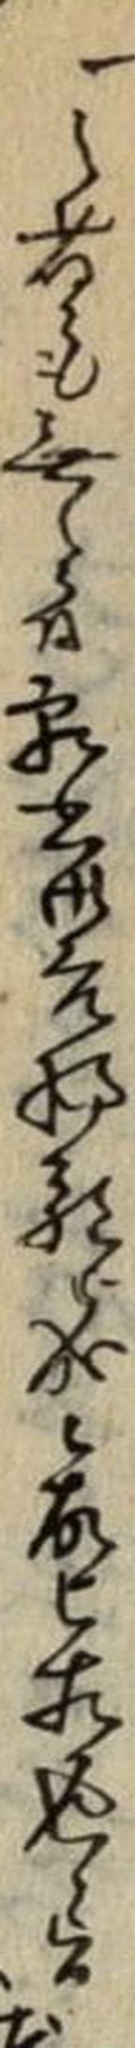之者ニも無之候ニ付願書御取揚難被成候故相返候旨
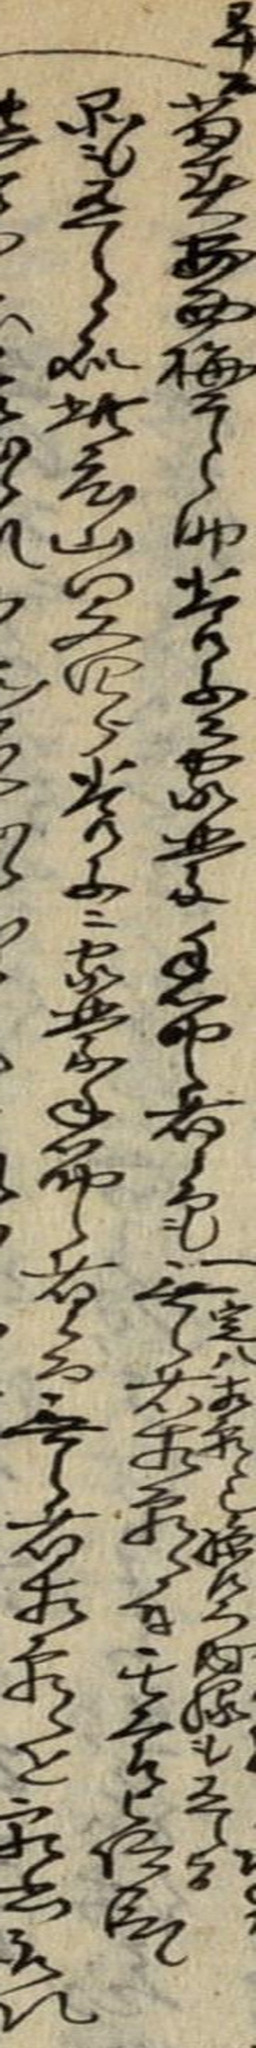品も有之処此度山田又四郎養子ニ家業手筋之者ニ而無之者相願候を願書取次
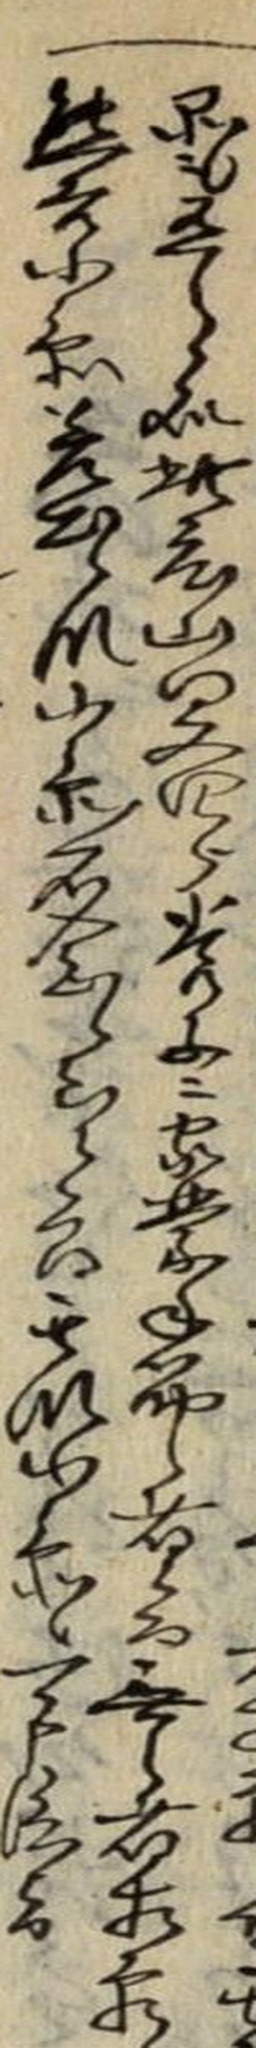熊谷小兵衛差出候段小兵衛不念之至ニ候間其段小兵衛へ可申渡旨
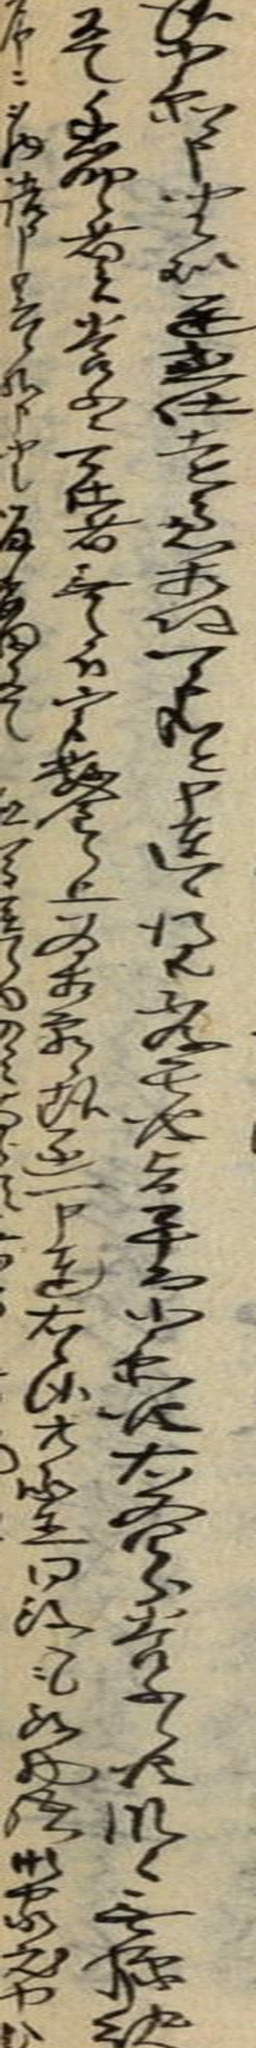合有之手筋之者ニハ養子可仕者無之ニ付穿鑿之上為相願候趣逐一申達右之趣共承置同役へも致物語御家老中へも
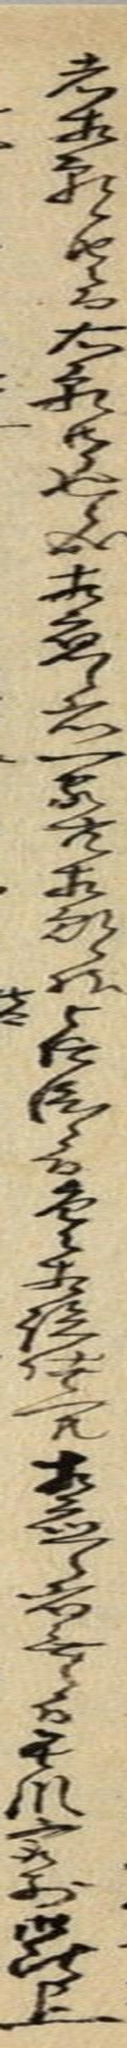者相願候由ニ而右願御返被成相応之者一家共相願候様被仰渡候ニ付色々相談仕候へ共相応之者無之ニ付其段最前御断申上
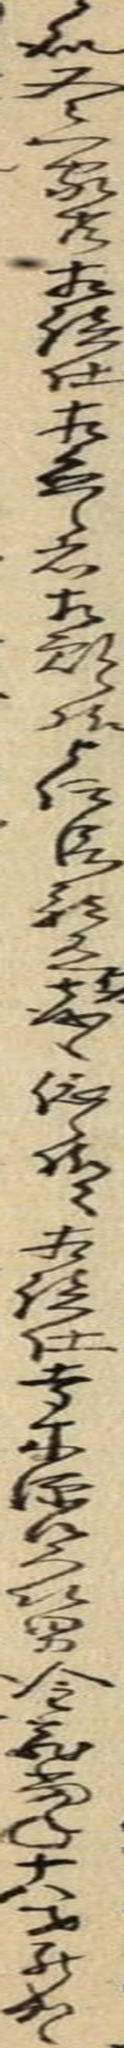候処又々一家共相談仕相応之者相願候被仰渡難有仕合奉存候依之様々相談仕寺木源左衛門次男金蔵当年十八才罷成候
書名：養子縁組之部
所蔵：福井県文書館 Fukui Prefectural Archives
